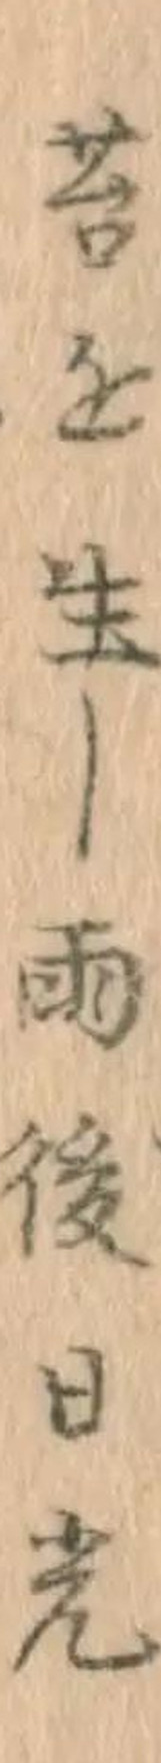苔を生し雨後日光
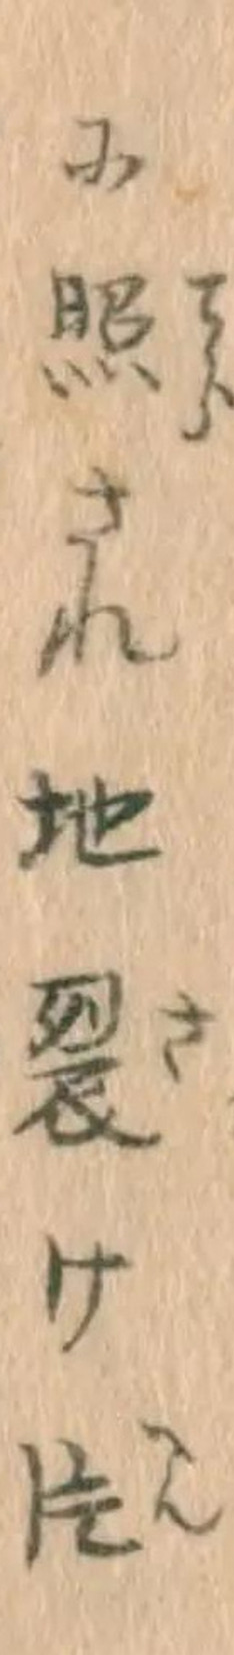に照され地裂け片
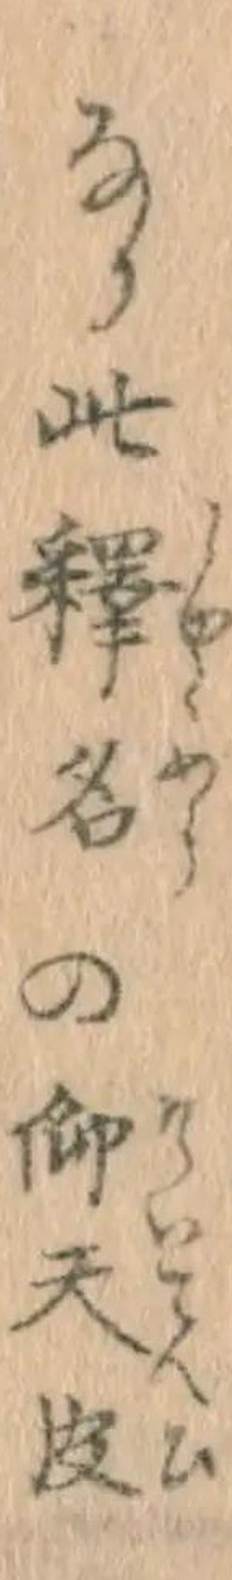なり此釈名の仰天皮
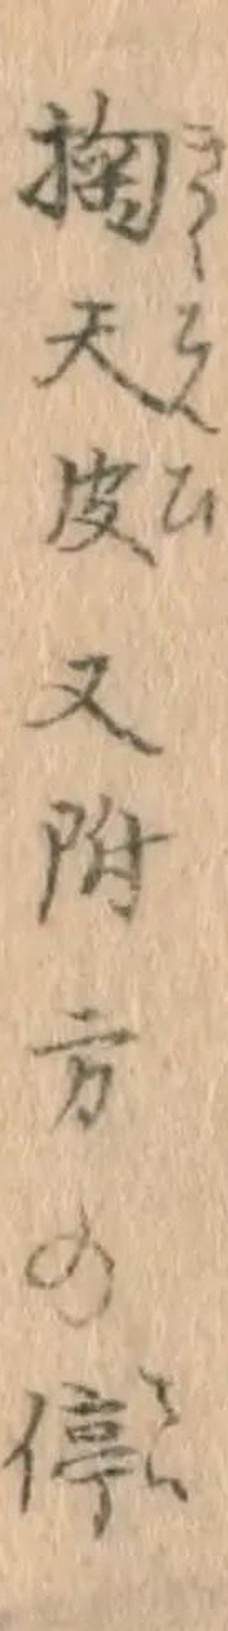掬天皮又附方の停
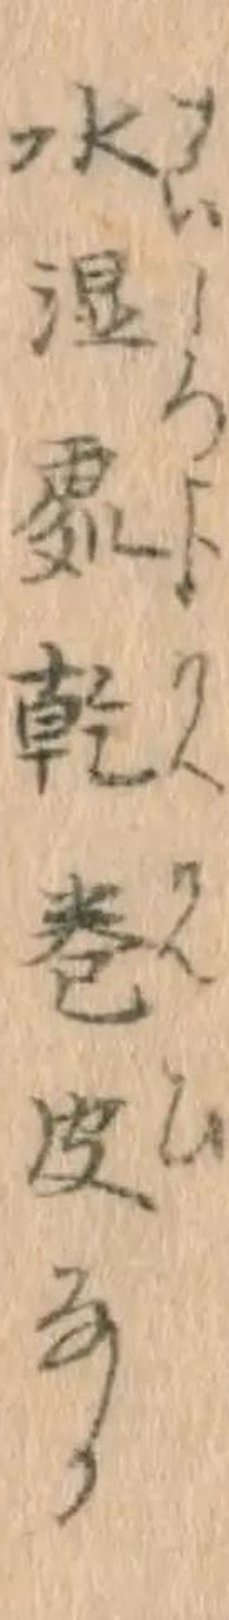水湿処乾巻皮なり
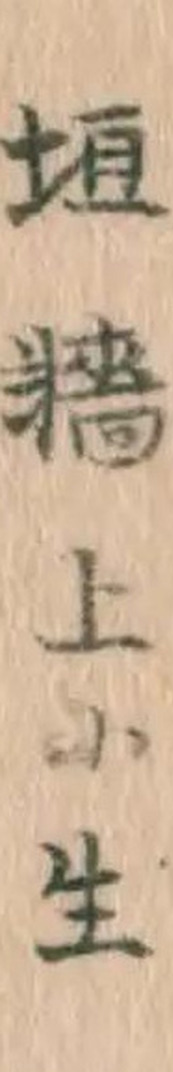垣牆上に生
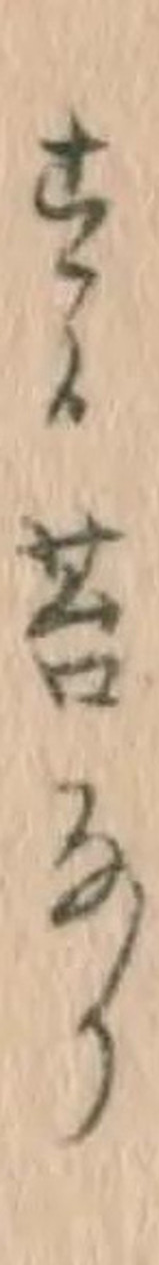する苔なり

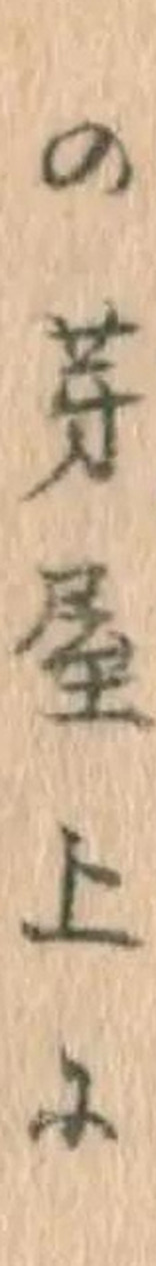の茅屋上に
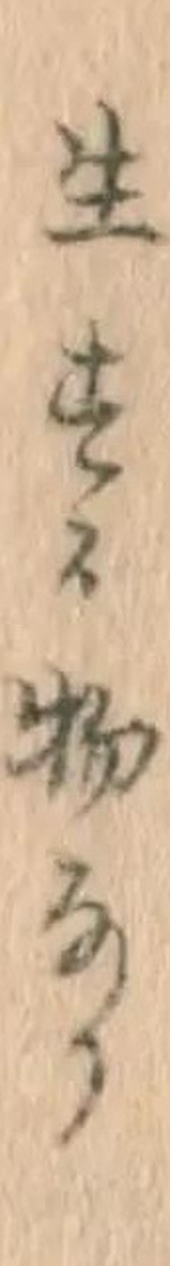生する物なり

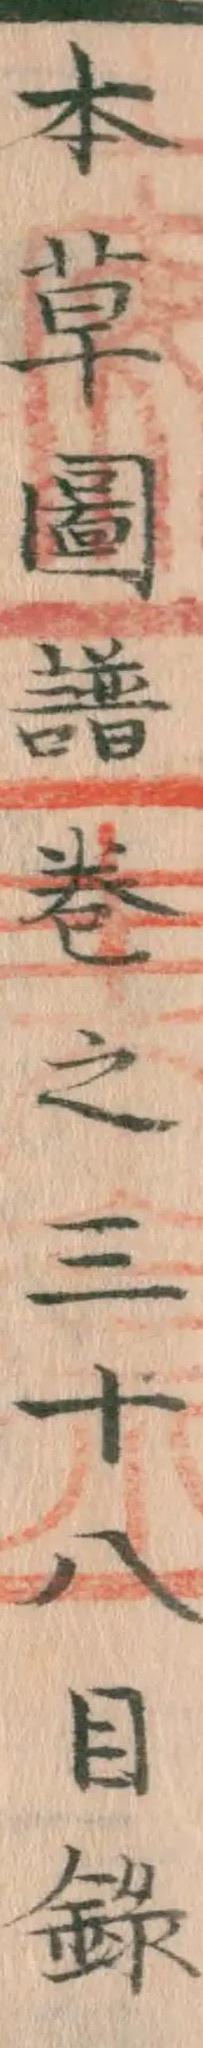本草図譜巻之三十八目録

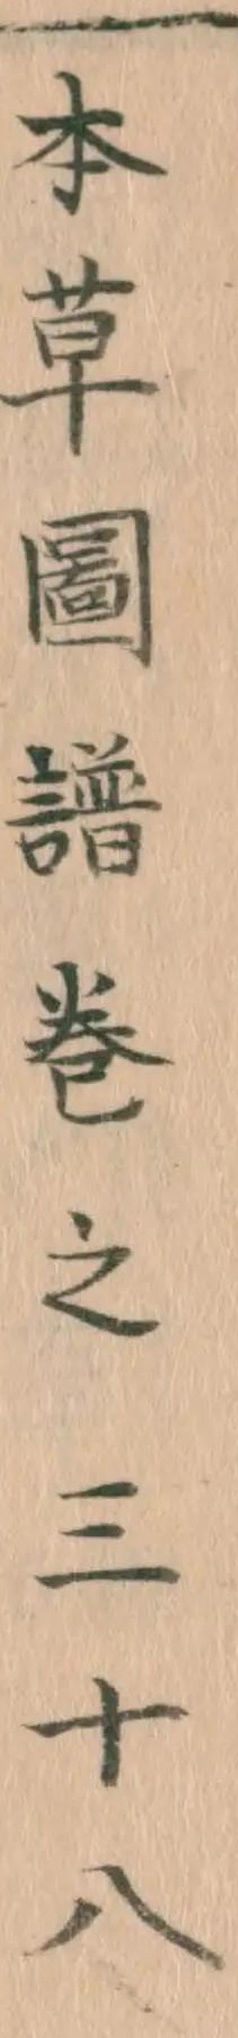本草図譜巻之三十八
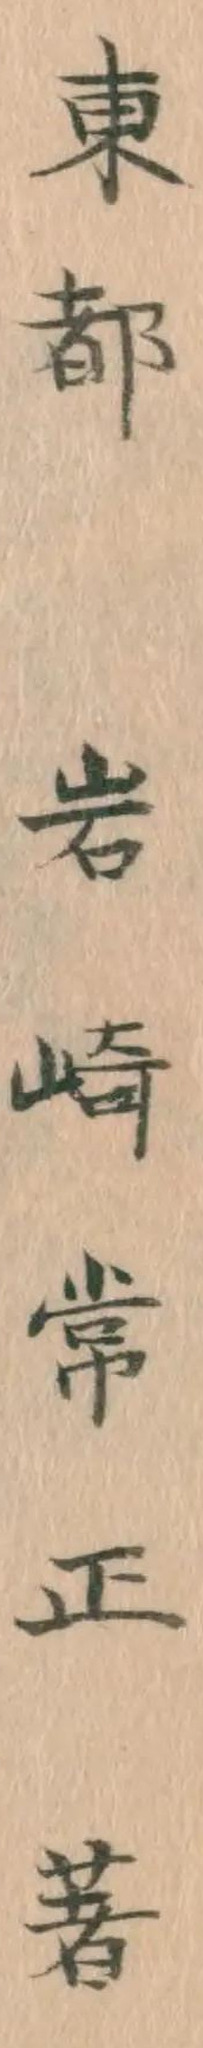東都岩崎常正著

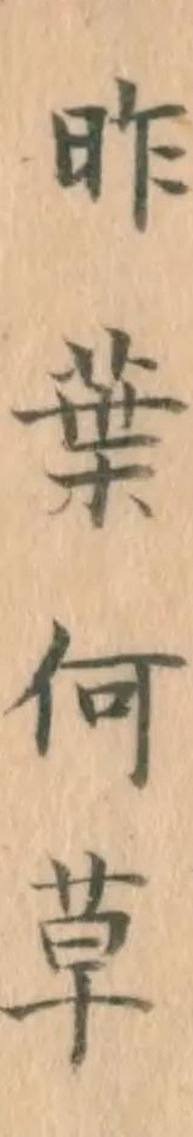昨葉何草
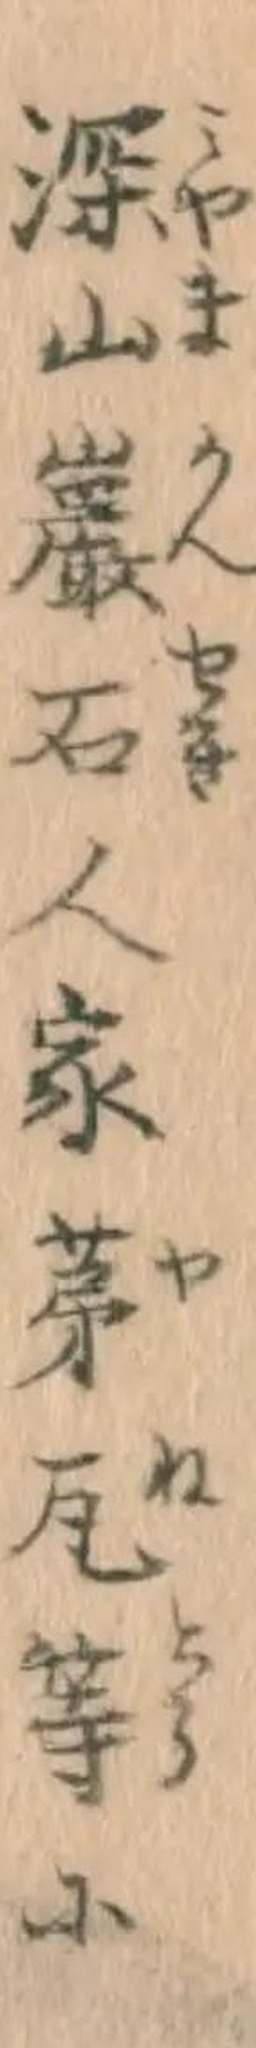深山巌石人家茅瓦等に
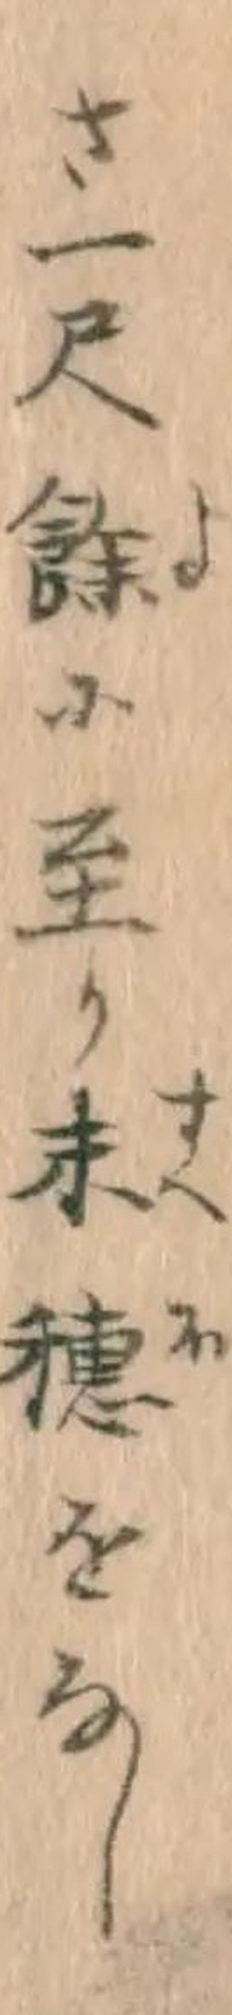さ一尺余に至り末穂をなし
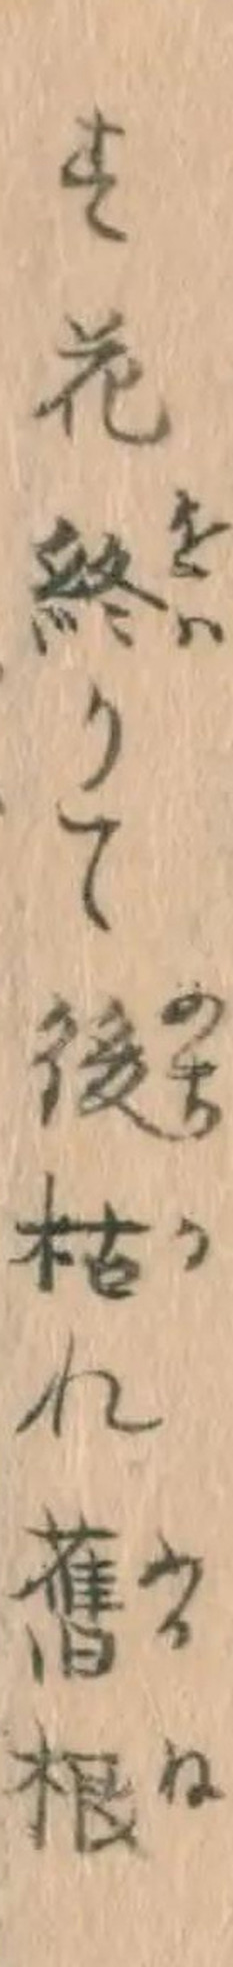す花終りて後枯れ旧根
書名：本草図譜. 巻37-39
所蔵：国立国会図書館 National Diet Library, JAPAN
